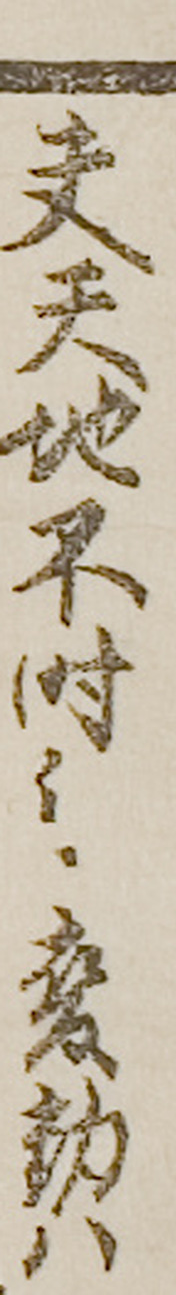夫天地不時之変動は
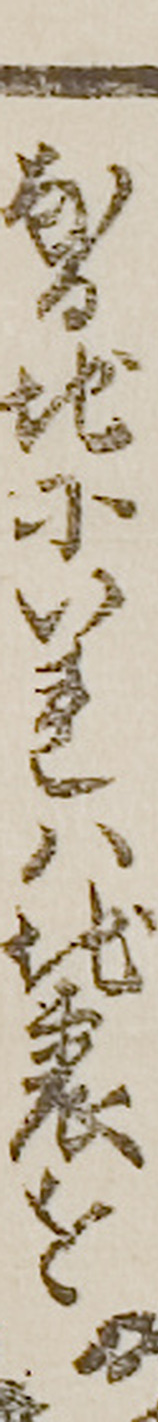なる地にいれは地震を
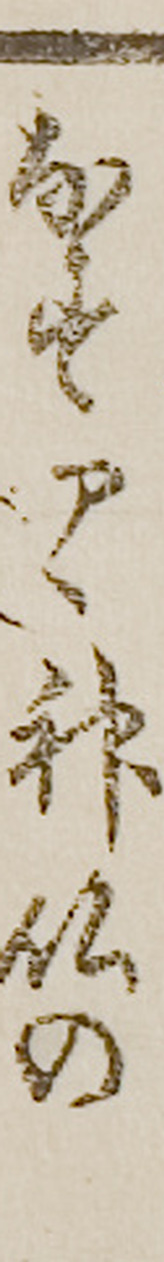なすアヽ神仏の
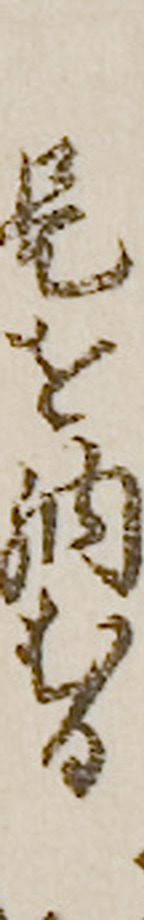是を納むる
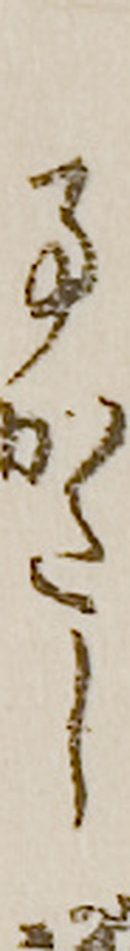事かたし
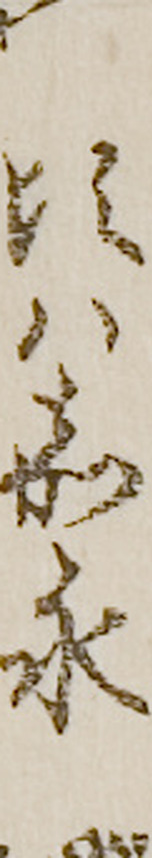頃は嘉永
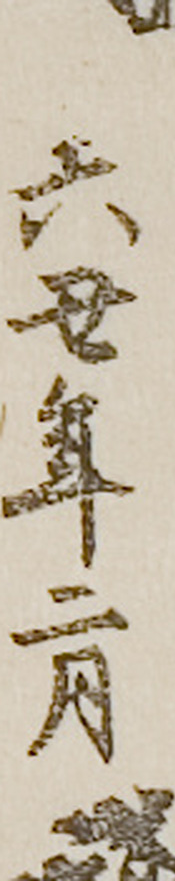六丑年二月
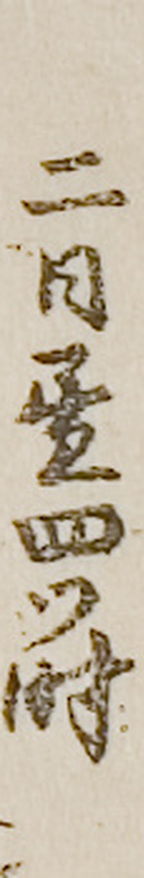二日昼四ツ時
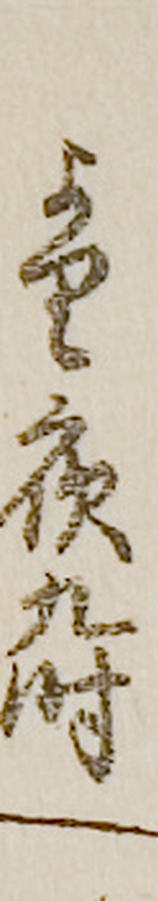より夜九時
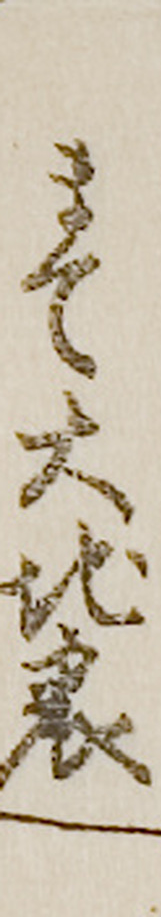まて大地震
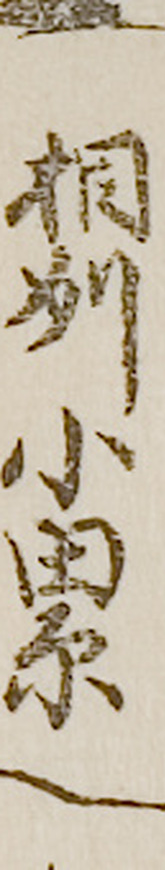相州小田原
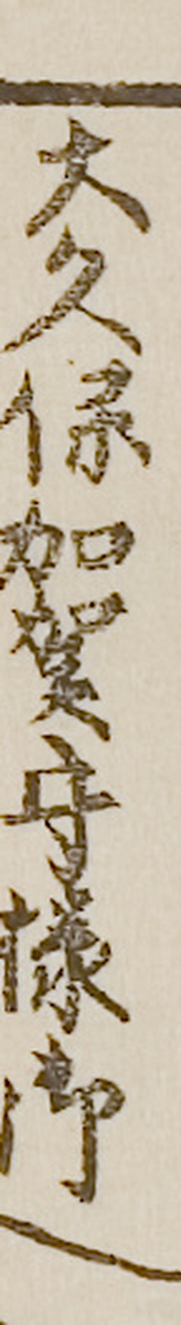大久保加賀守様御
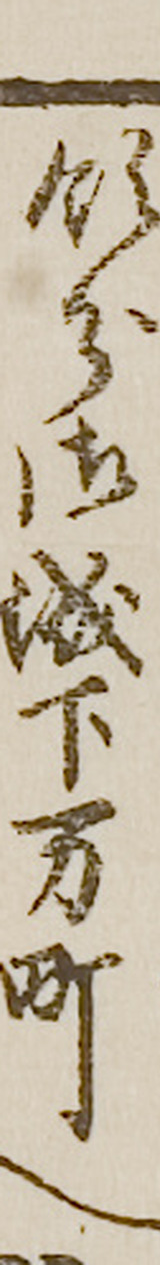領分御城下万町
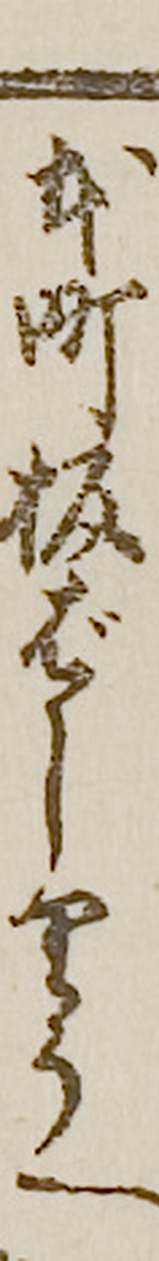本町板ばしりう
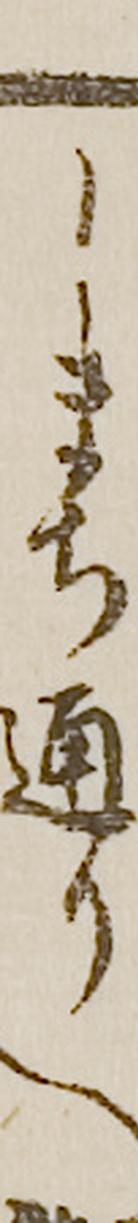しまち通り
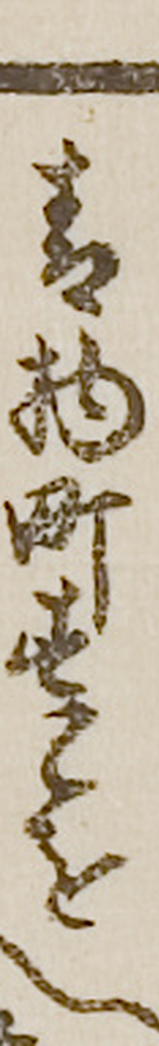青物町すわを
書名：出方山おしぬけ
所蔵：東京大学総合図書館 General Library in the University of Tokyo, JAPAN
